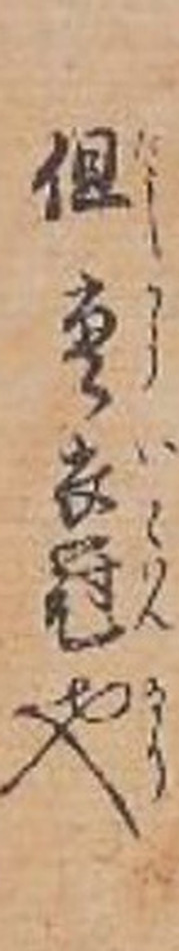但唐衣冠也
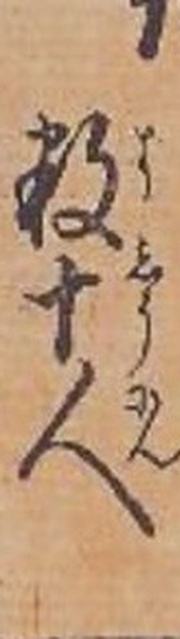数十人

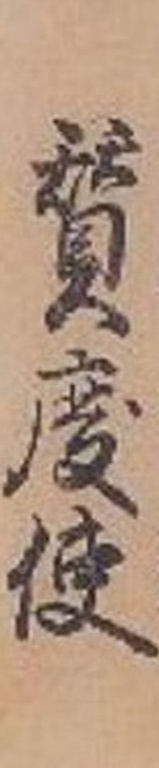賛度使
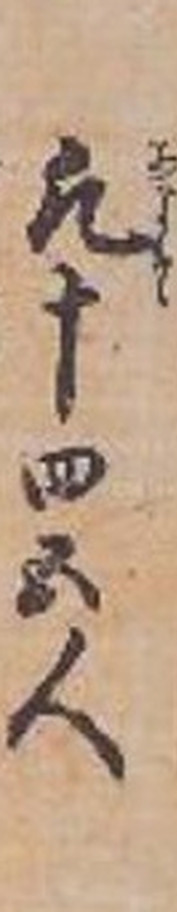凡十四五人
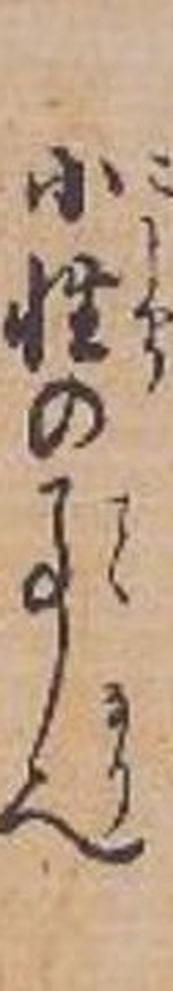小姓の事也
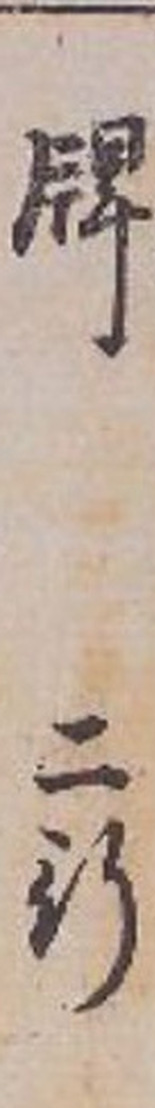牌二行
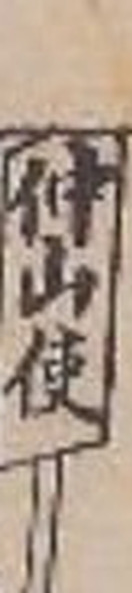仲山使
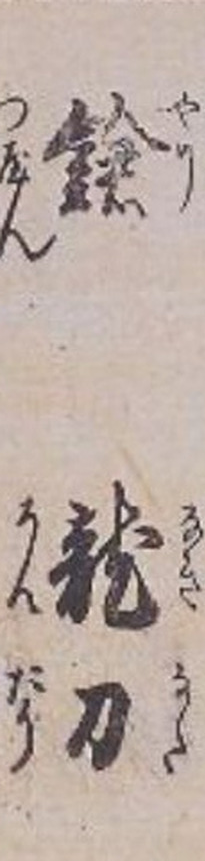鎗龍刀
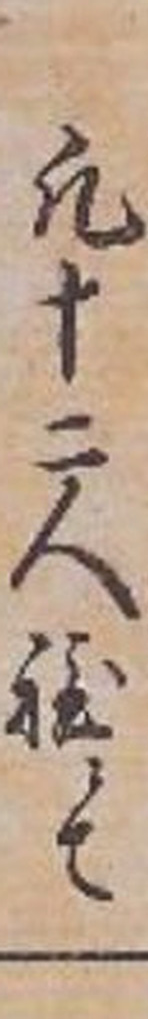凡十二人程にて

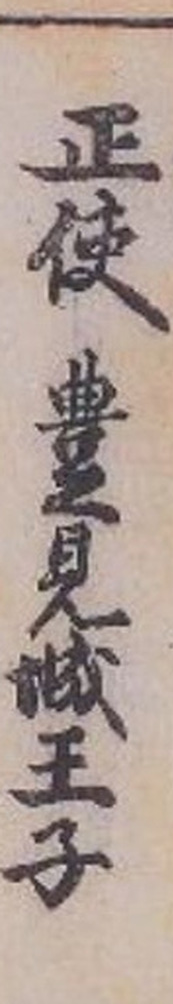正使豊見城王子
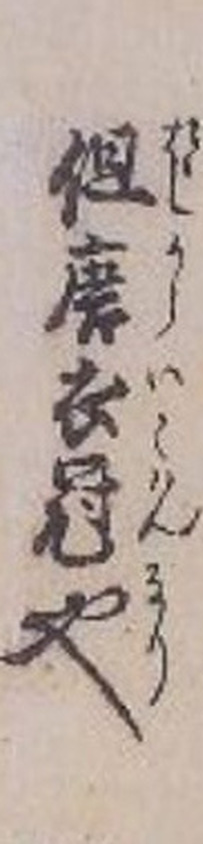但唐衣冠也
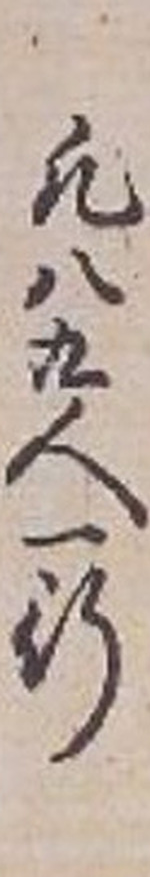凡八九人一行
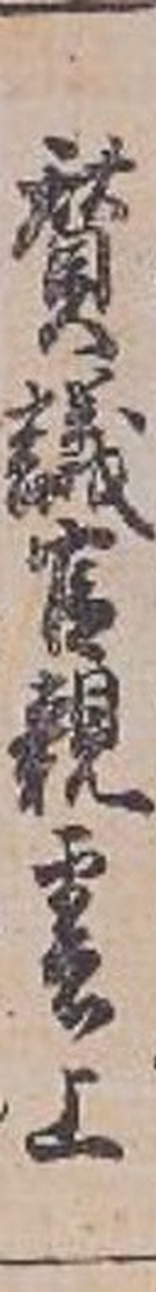賛議官親雲上
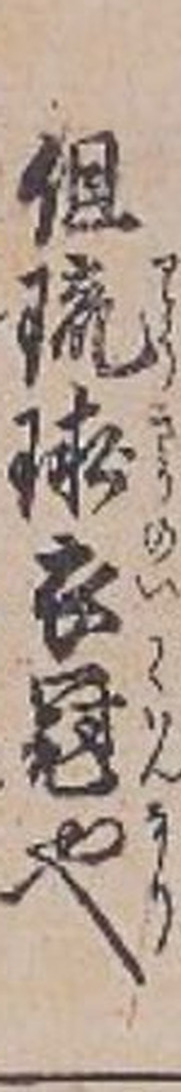但琉球衣冠也
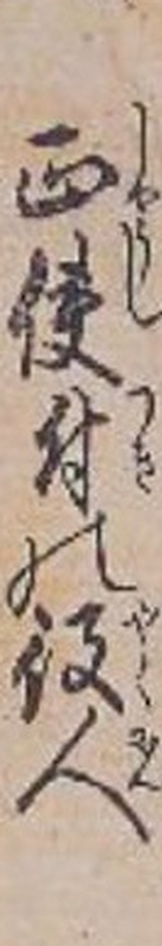正使付の役人

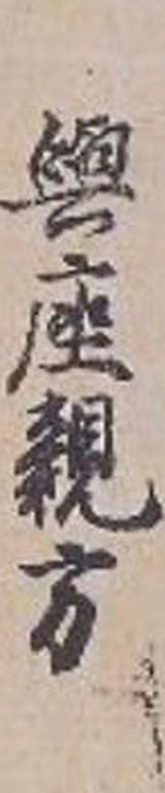與座親方
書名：琉球人大行列記 大全 来朝新板絵入
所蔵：University of the Ryukyus Library
